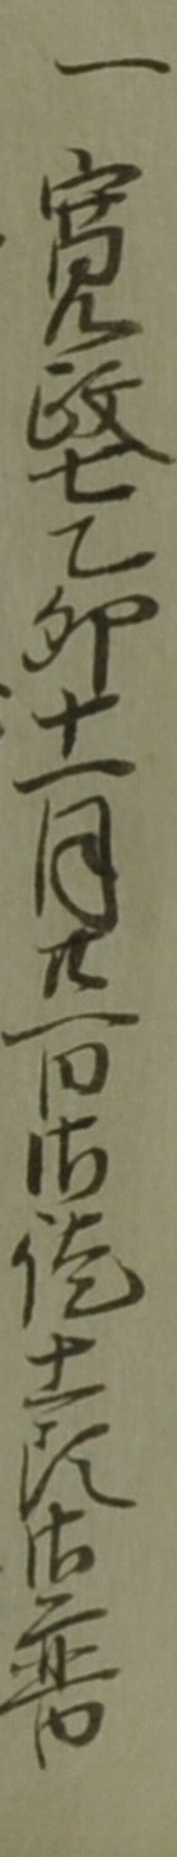一寛政七乙卯十一月廿一日御徒士頭御普
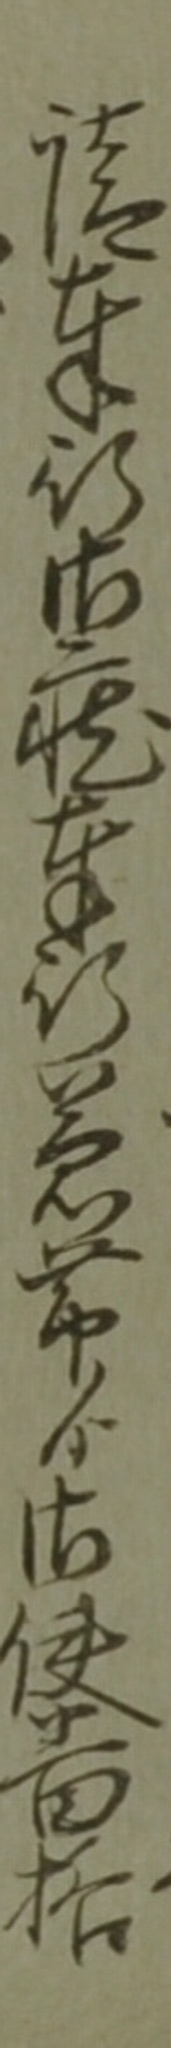請奉行御蔵奉行兼帯ゟ御使番格
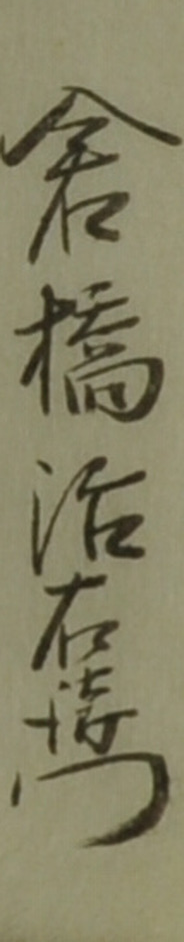倉橋治右衛門
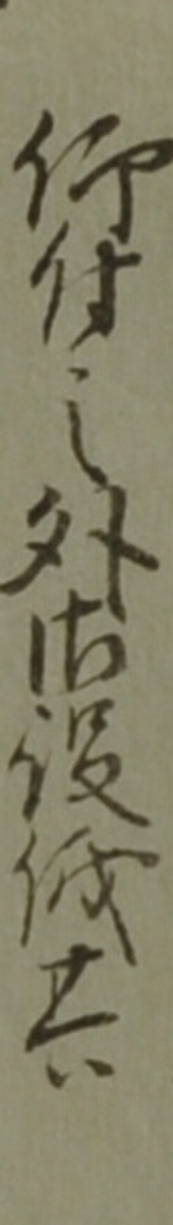仰付之外御役儀共御免
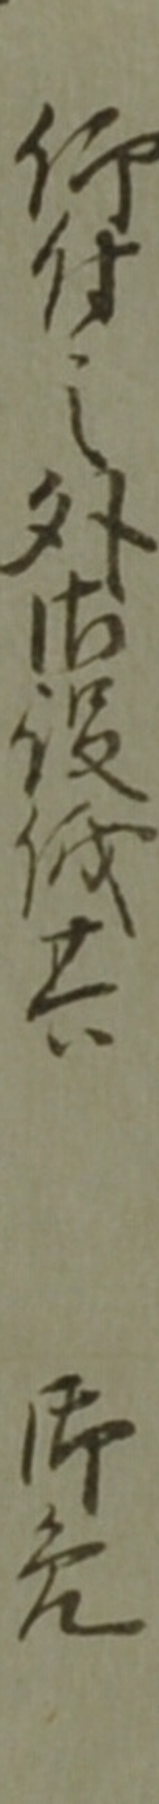仰付之外御役儀共御免
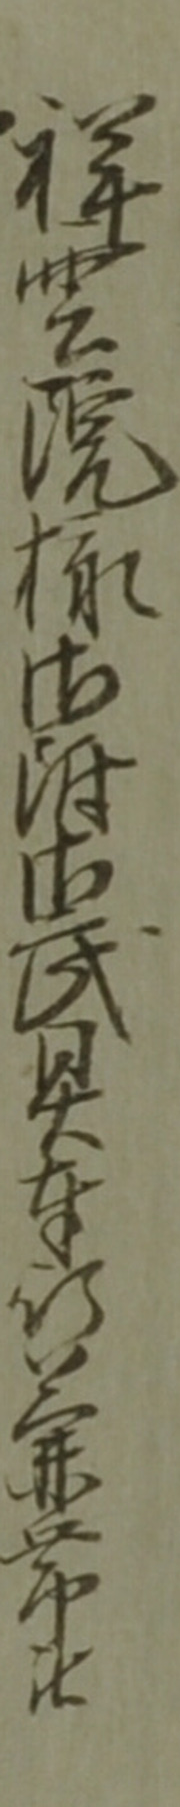祥雲院様御附御武具奉行兼帯被
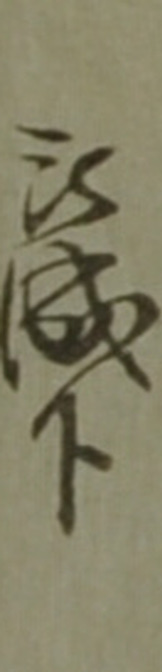被成下
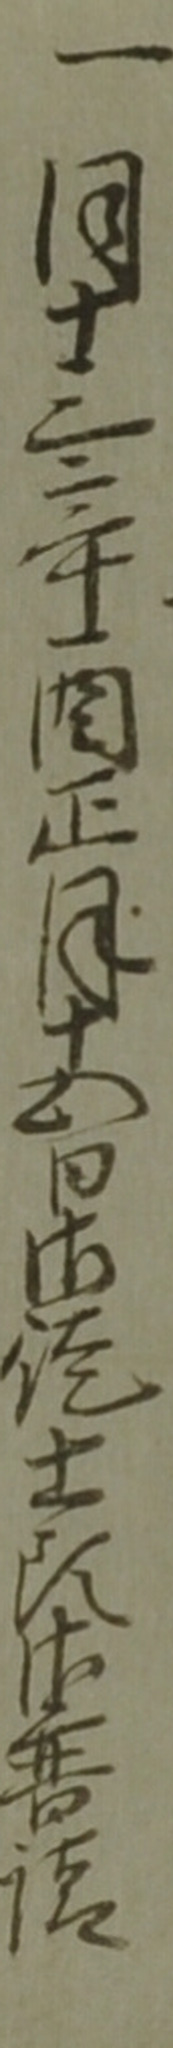一同十三辛酉正月十五日御徒士頭御普請
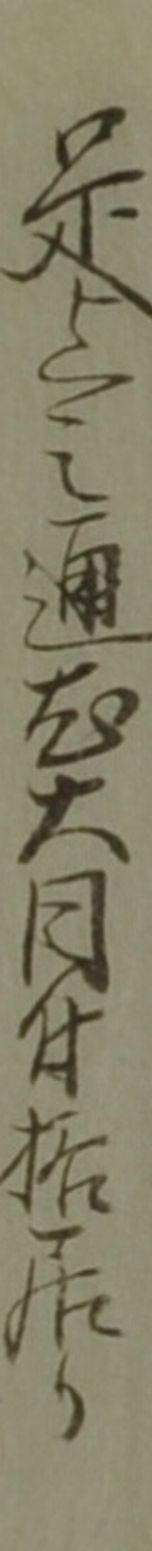是迄之通尤大目付格居り
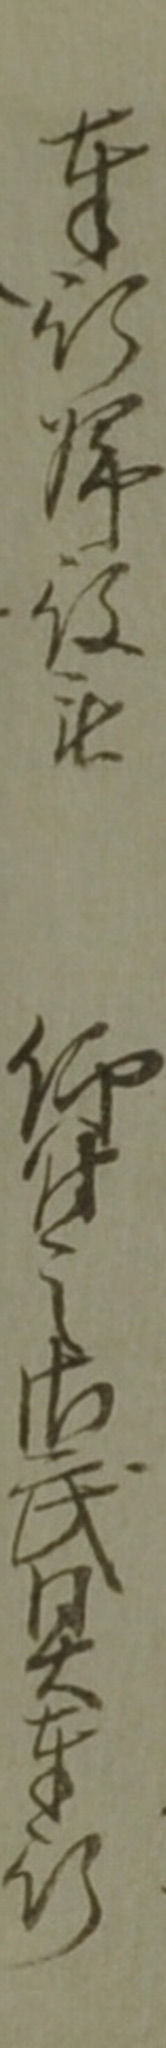奉行帰役被仰付之御武具奉行
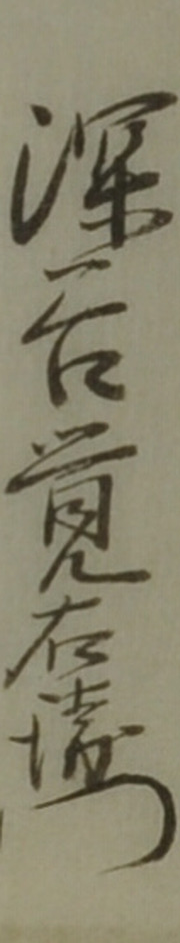深谷覚右衛門
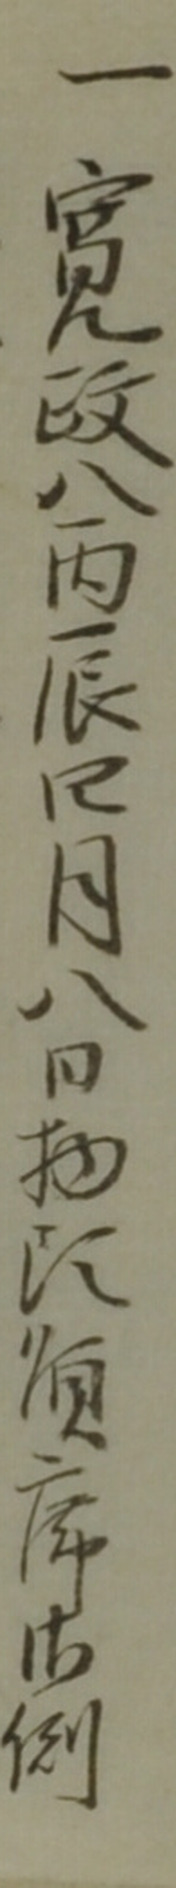一寛政八丙辰四月八日物頭順席御側
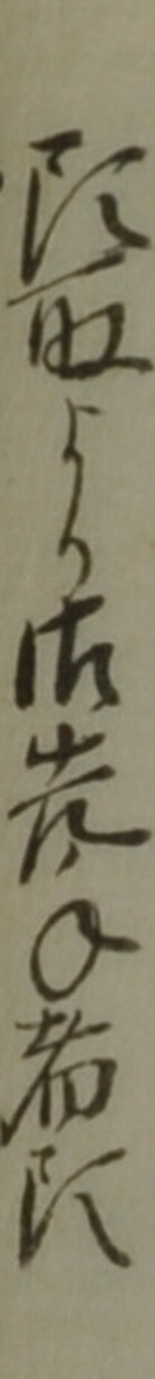頭取より御先手者頭
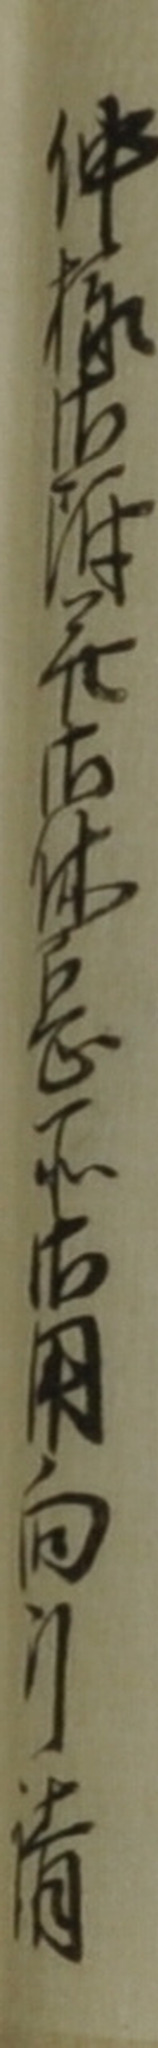仲様御附并御休息所御用向引請
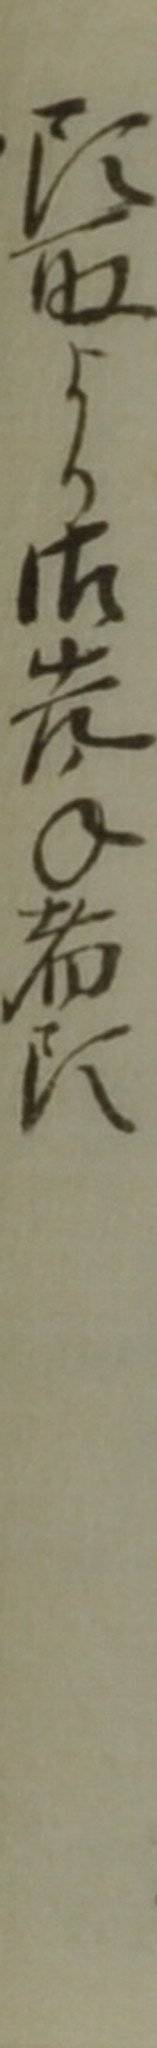頭取より御先手者頭
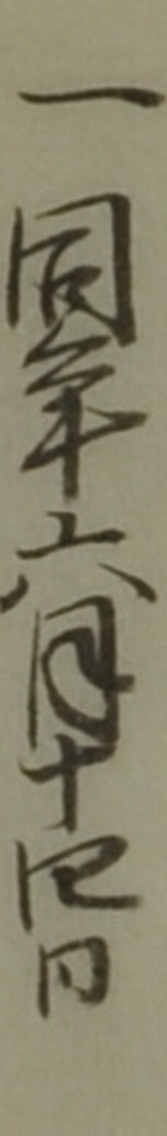一同年六月十四日
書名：諸御役代々録（六）
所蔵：伊那市立高遠町図書館・合同会社AMANE
